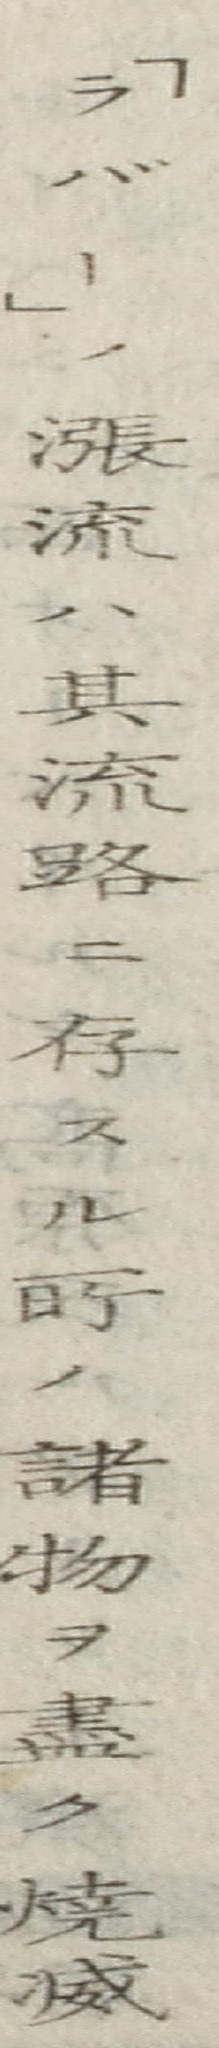「ラバー」ノ漲流ハ其流路ニ存スル所ノ諸物ヲ盡ク焼滅
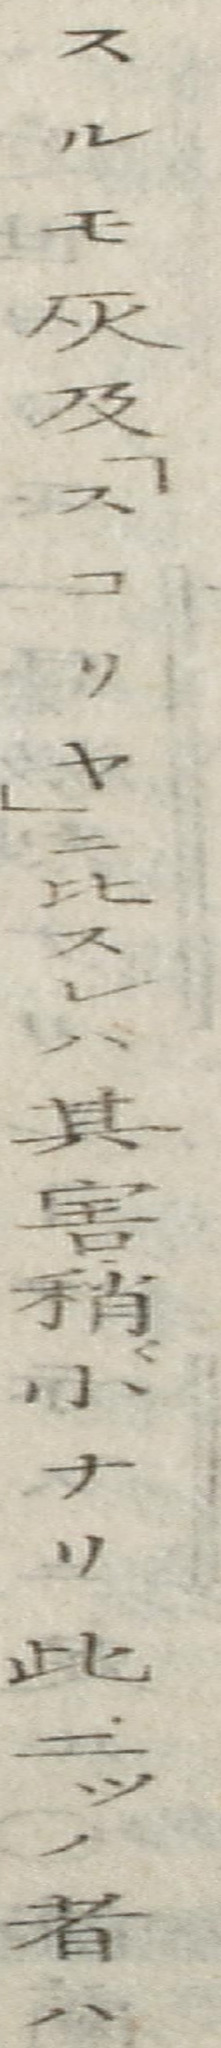スルモ灰及「スコリヤ」ニ比スレハ其害稍小ナリ比二ツノ者ハ
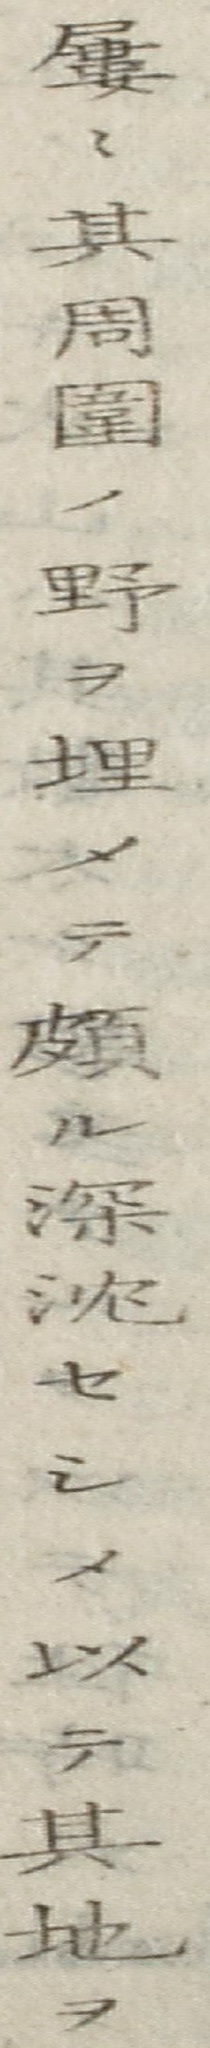屢ニ其周囲ノ野ヲ埋メテ頗ル深沈セシメ以テ其地ヲ
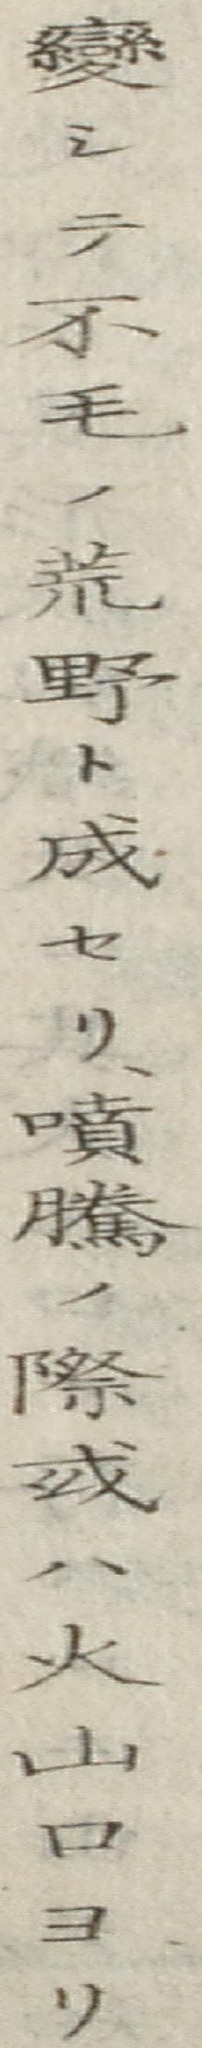変シテ不毛ノ荒野ト成セリ、噴騰ノ際或ハ火山口ヨリ
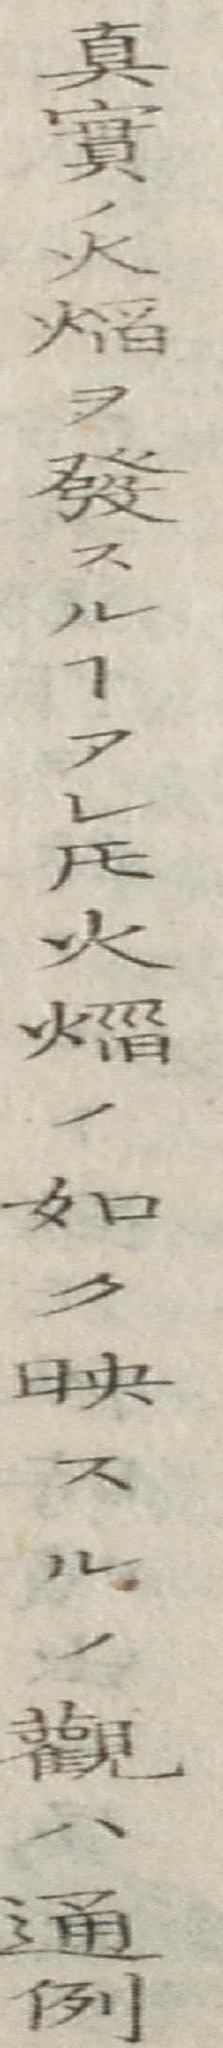真実ノ火焔ヲ発スルヿアレトモ火焔ノ如ク映スルノ観ハ通例
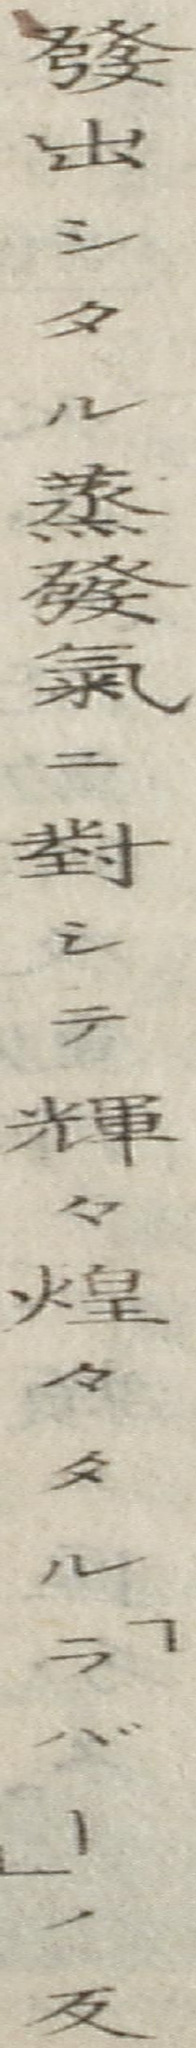発出シタル蒸発気ニ封シテ輝々煌々タル「ラバー」ノ反
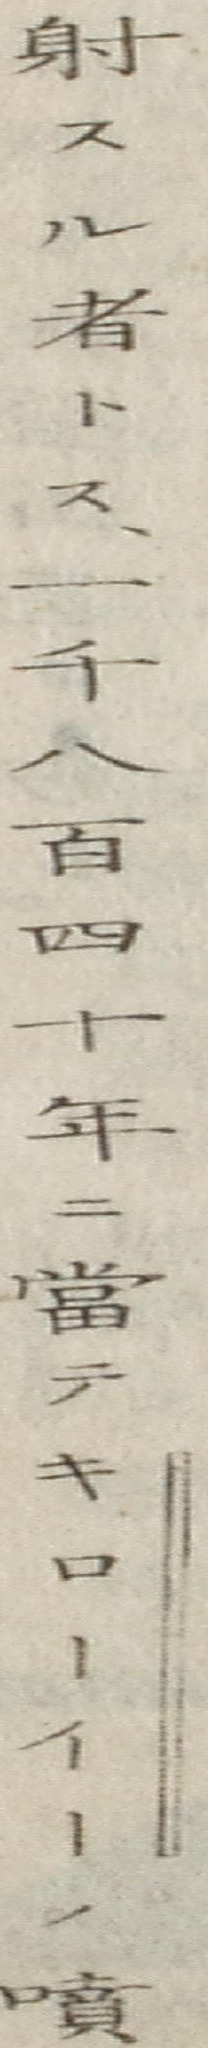射スル者トス、一千八百四十年ニ当テキローイーノ噴
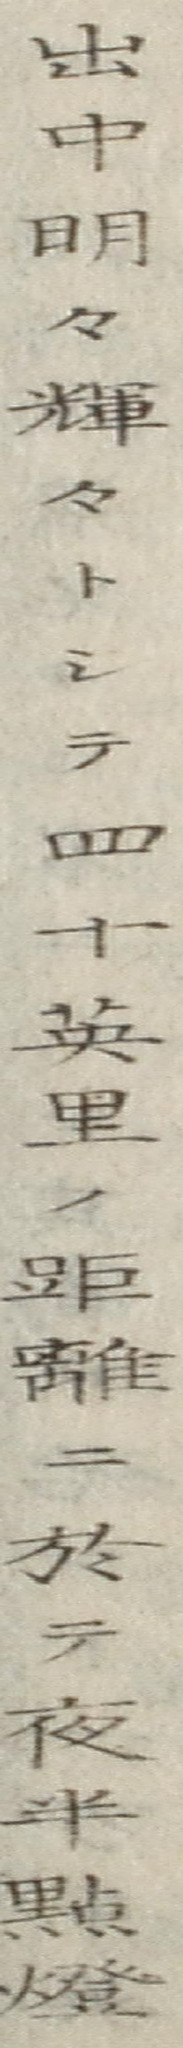出中明々輝々トシテ四十英里ノ距離ニ於テ夜半点燈
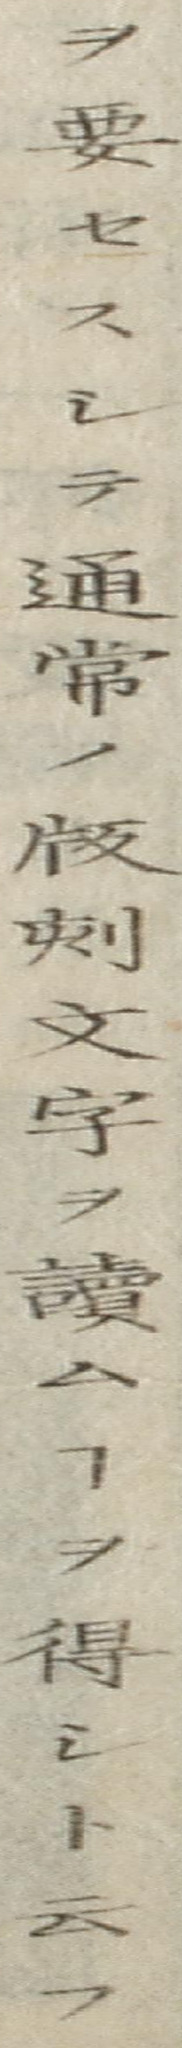ヲ要セスシテ通常ノ版刻文字ヲ読ムヿヲ得シト云フ
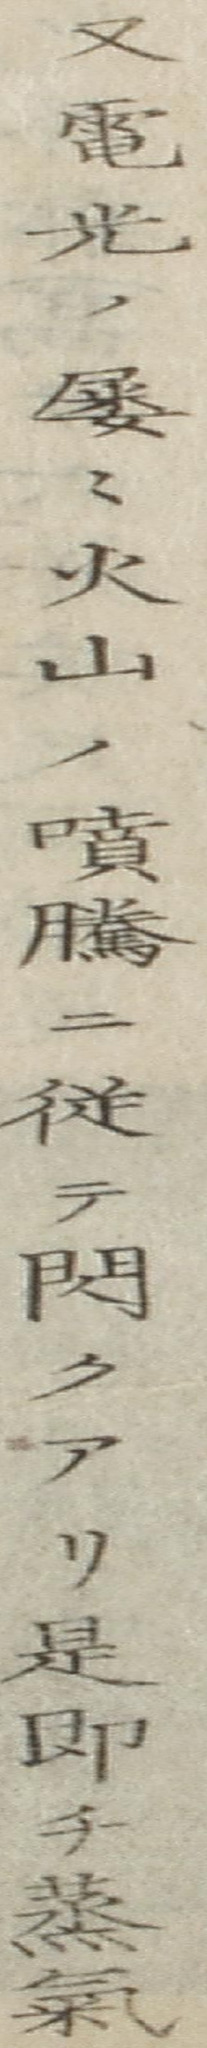又電光ノ屡々火山ノ噴騰ニ従テ閃クアリ是即チ蒸気
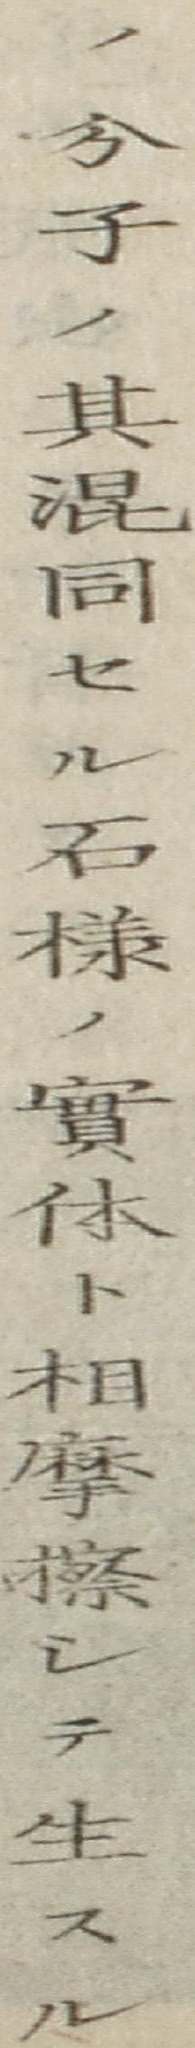ノ分子ノ其混同セル石様ノ実体ト相摩擦シテ生スル
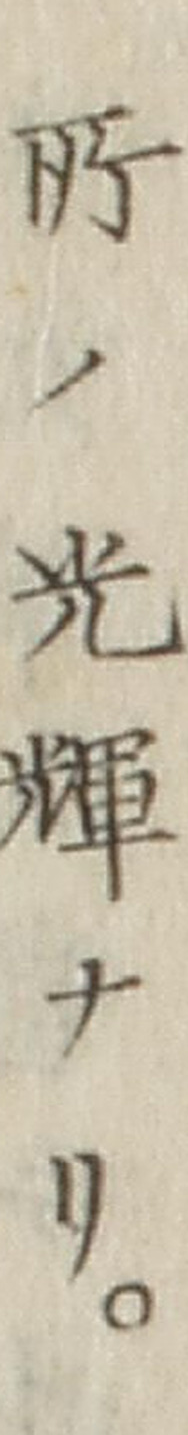所ノ光輝ナリ。
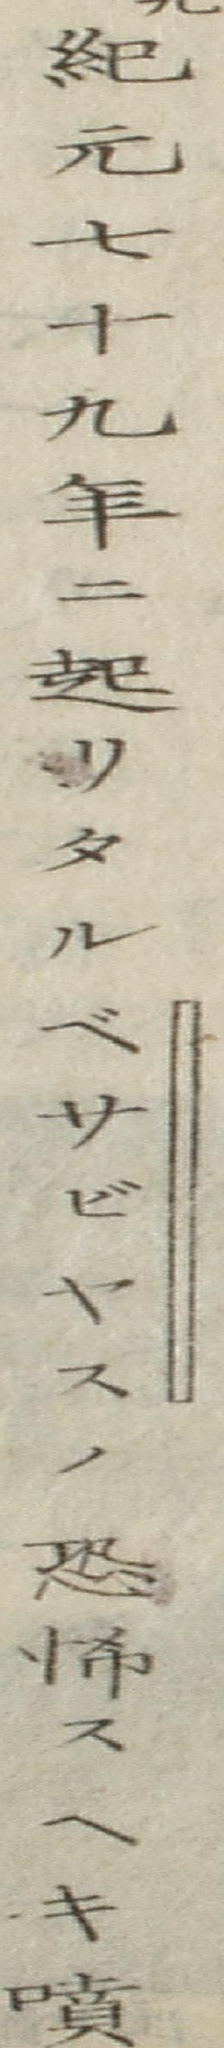九紀元七十九年ニ起リタルベサビヤスノ恐怖スヘキ噴
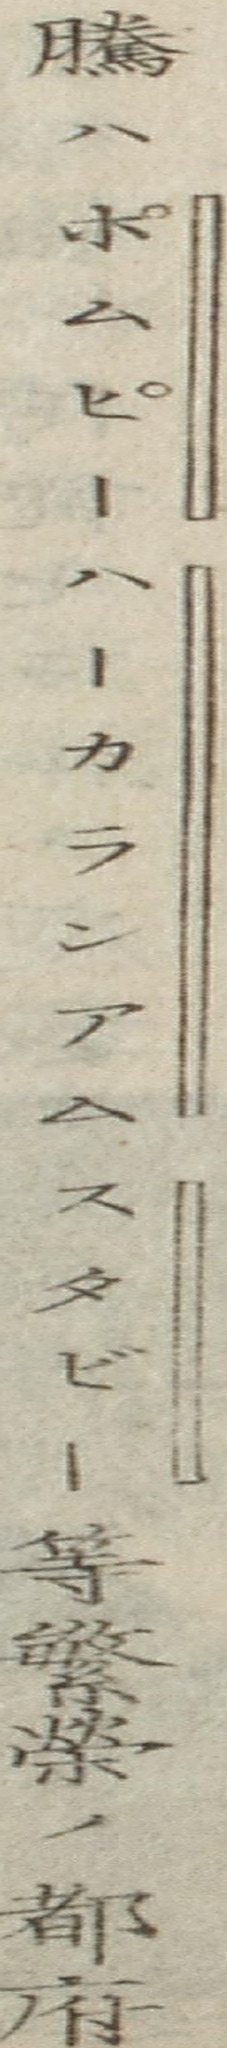騰ハポムピーハーカラシアムスタビー等繁栄ノ都府
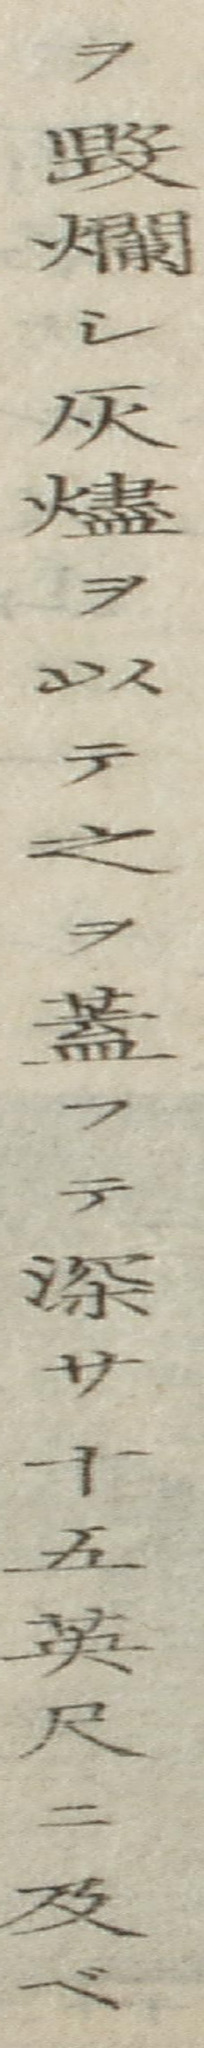ヲ毀爛シ灰燼ヲ以テ之ヲ蓋フテ深サ十五英尺ニ及ベ
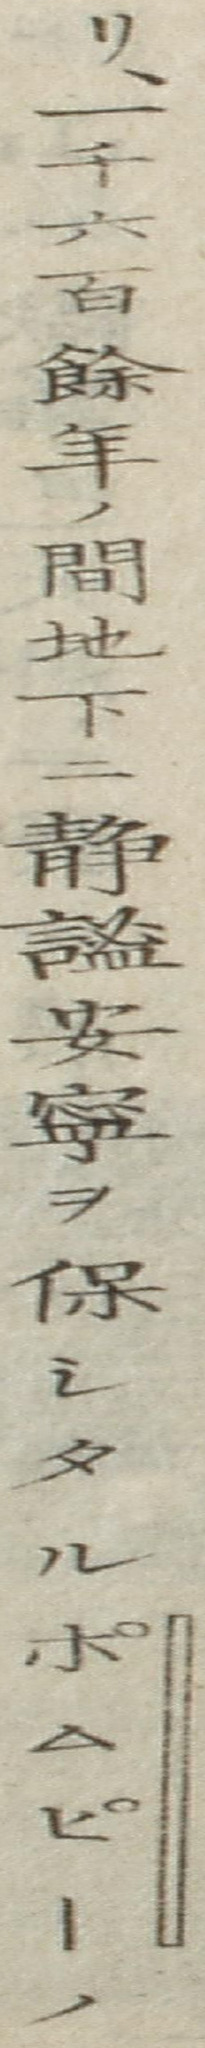リ、一千六百餘年ノ間地下ニ静謐安寧ヲ保シタルポムピーノ
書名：地形論　巻二
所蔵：東京大学地震研究所図書室 Earthquake Research Institute Library, The University of Tokyo, JAPAN
